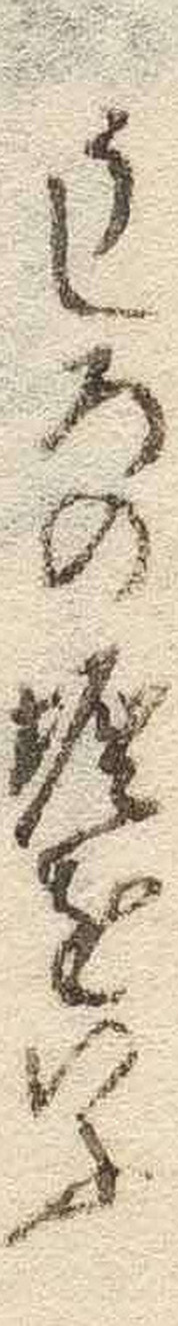うしろの堀をいふ
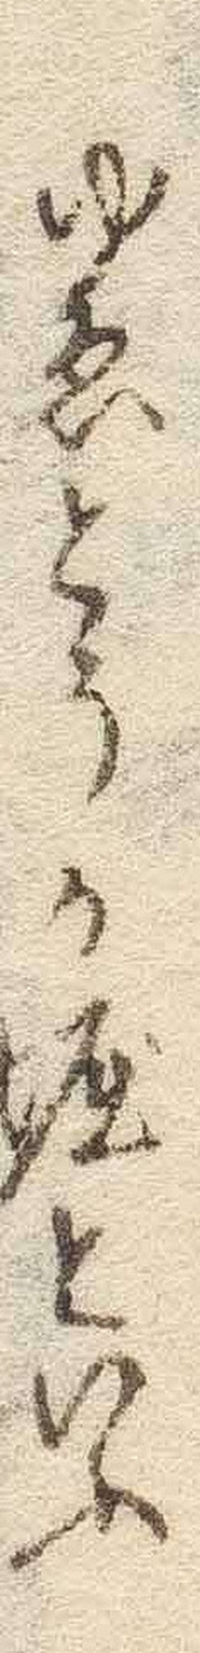ゆゑとうか堀といふ
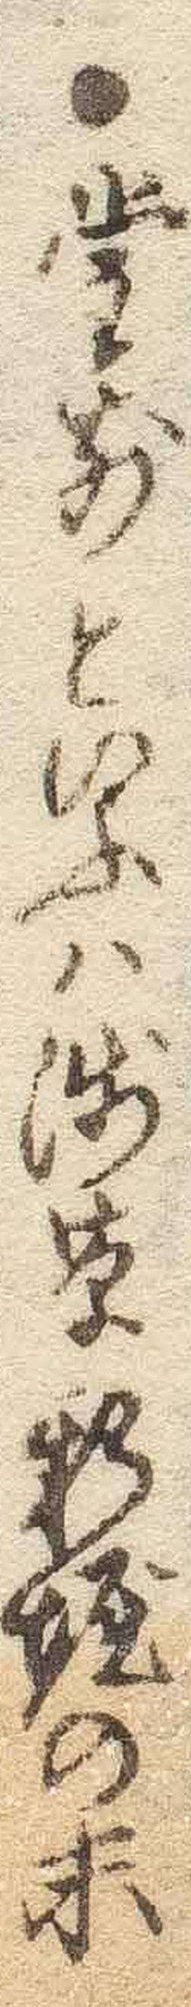・堂前といふは浅草新堀の末
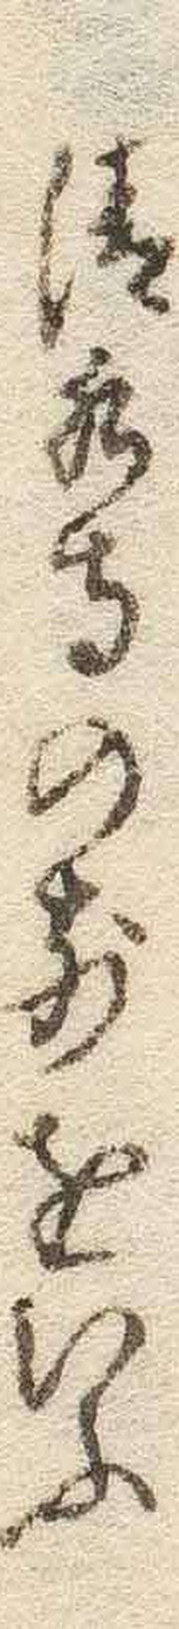清水寺の前をいふ
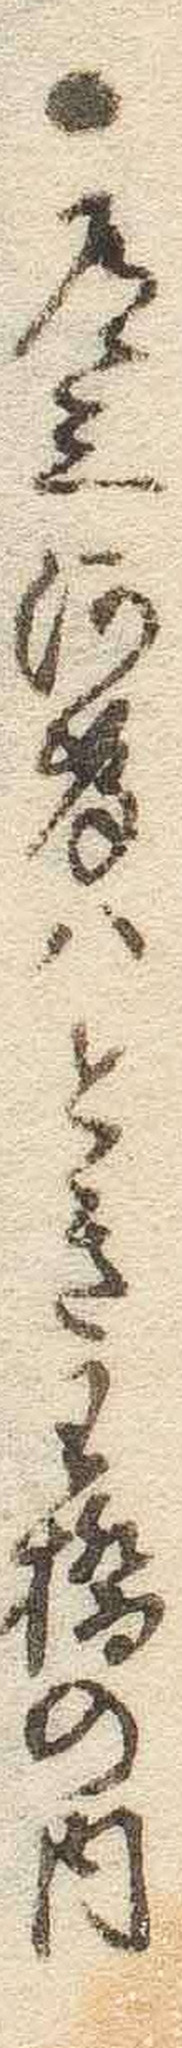・道三河岸はときわ橋の内
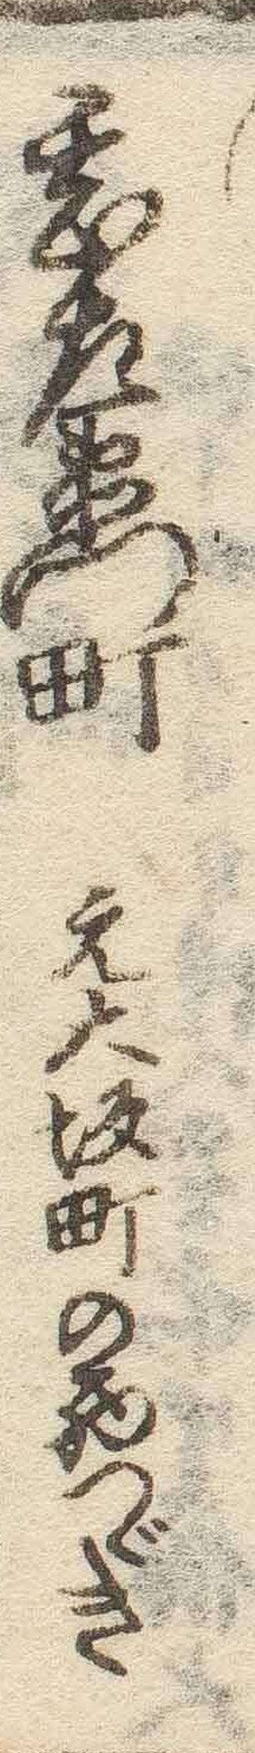甚左衛門町元大坂町の西つゞき
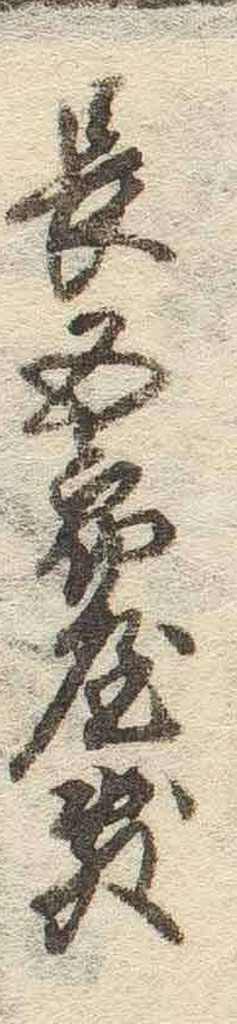長五郎屋敷
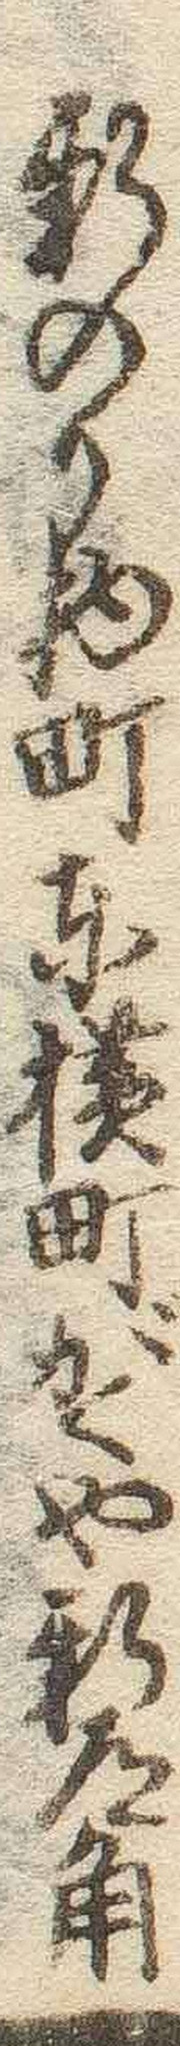新のり物町東横町がくや新道角
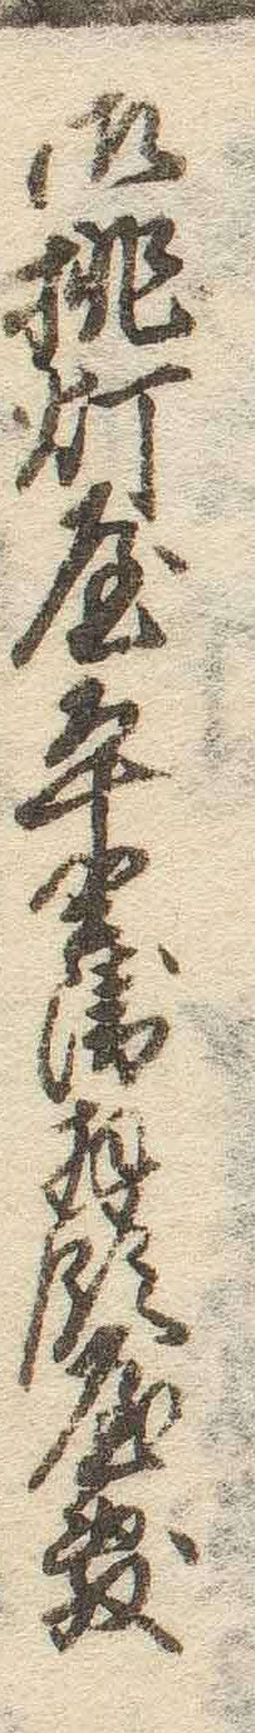御挑灯屋平兵衛拝領屋敷
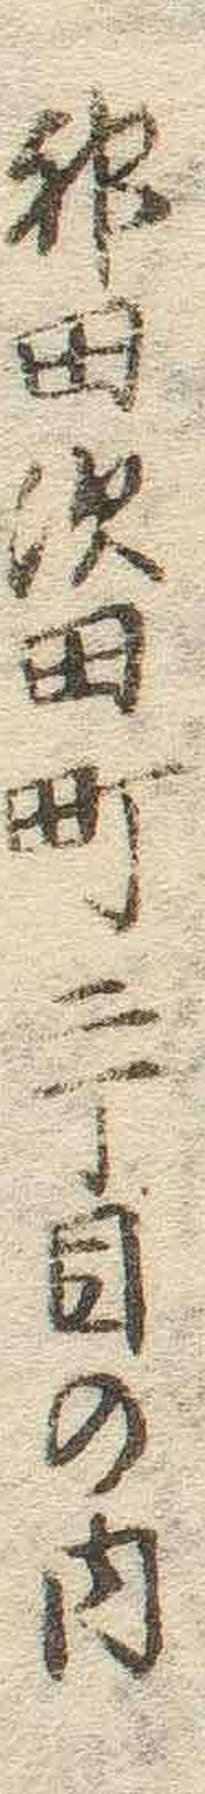神田須田町二丁目の内
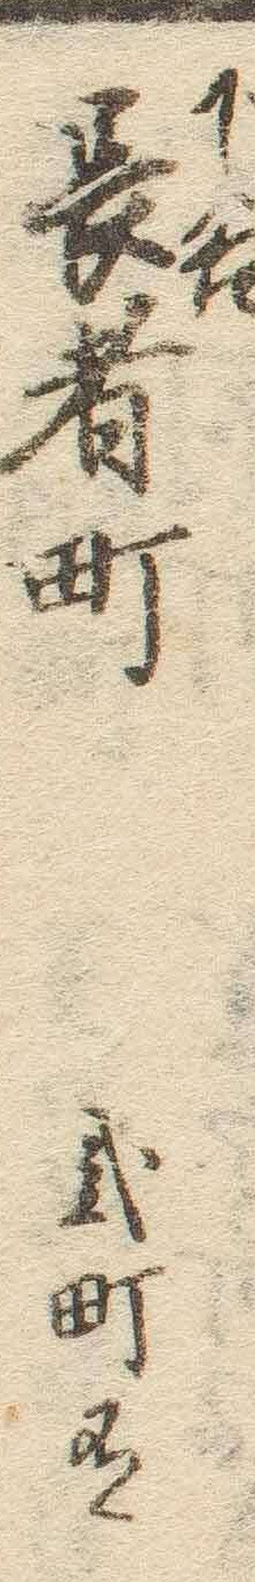長者町弐町有
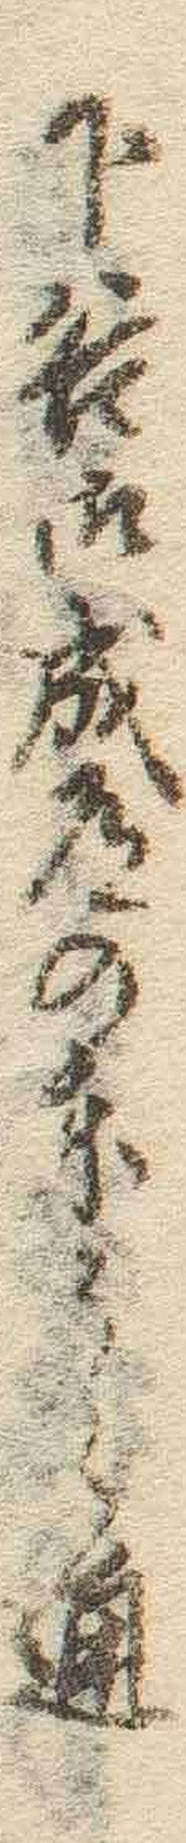下谷御成道の東うら通
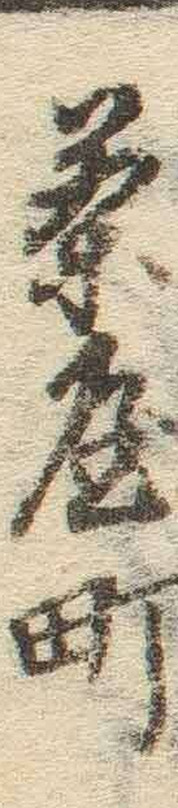茶屋町
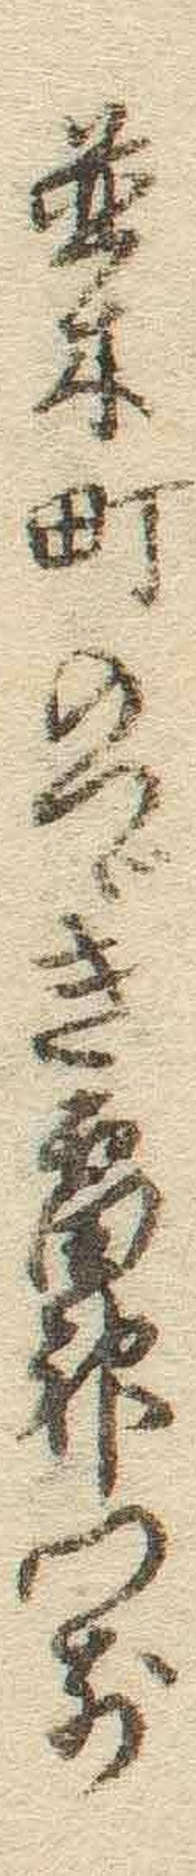並木町のつゞき雷神門前
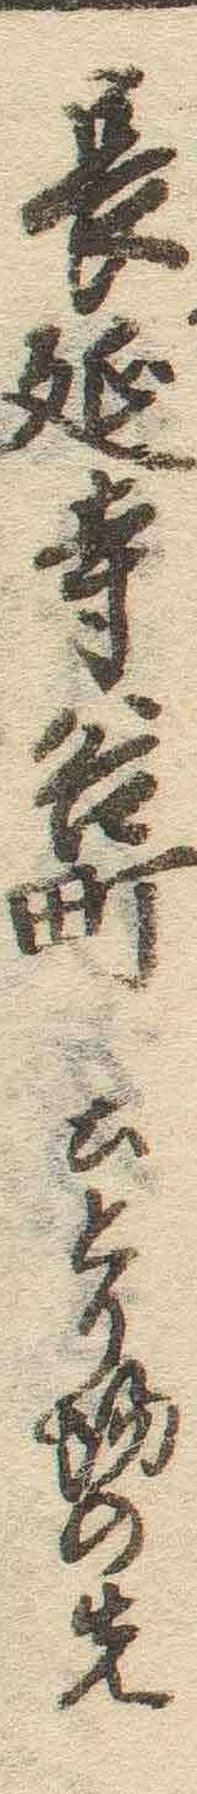長延寺谷町土とり場の先
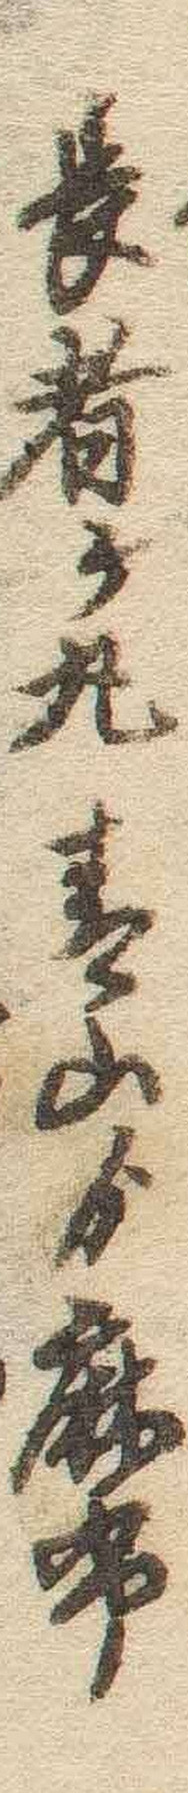長者ヶ丸青山ゟ麻布
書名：江戸町独案内
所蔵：東京学芸大学附属図書館 国文学研究資料館
